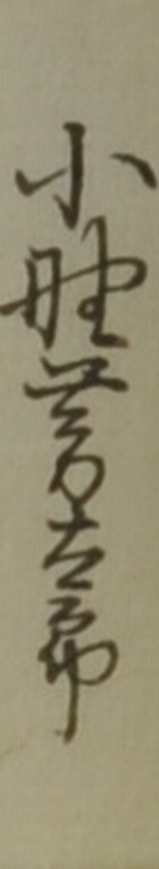小野芳太郎
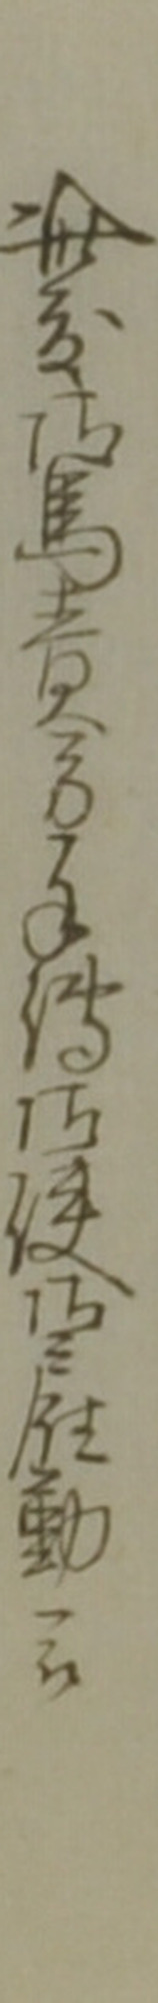此度御馬責方手伝御使御雇勤被
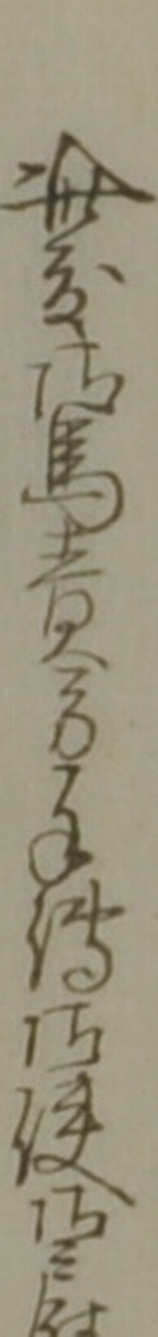此度御馬責方手伝御使御雇勤被
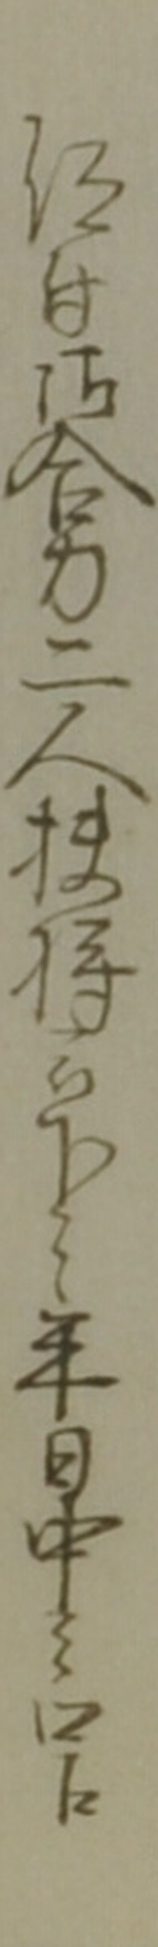仰付御合力二人扶持被下之平日中之口江
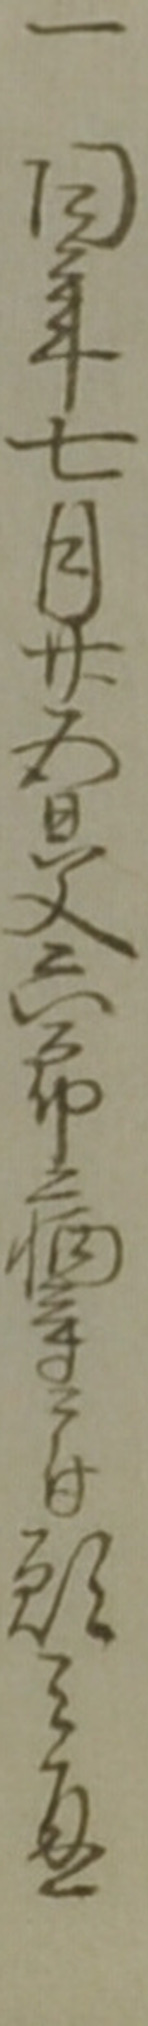一同年七月廿五日父六郎病気ニ付願之通
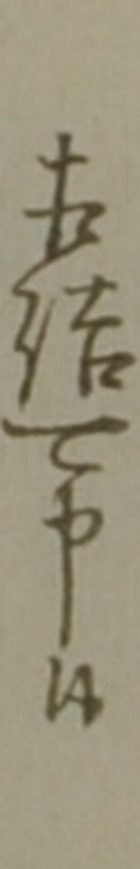相詰可申候

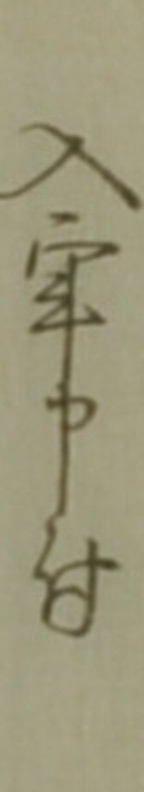入牢申付
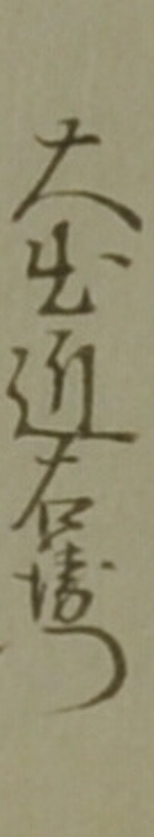大出近右衛門
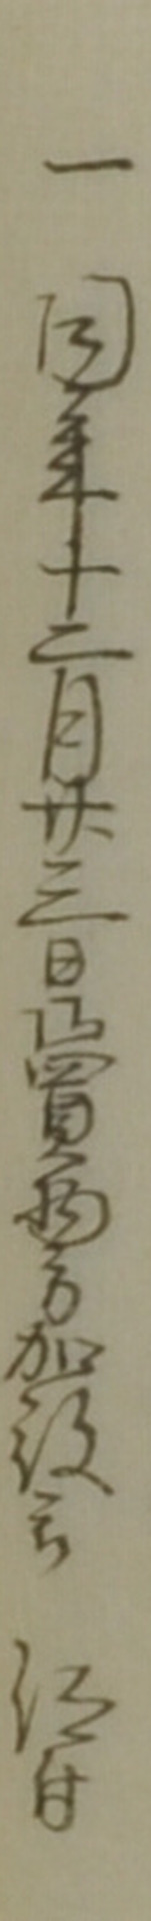一同年十二月廿三日御買物方加役被仰付
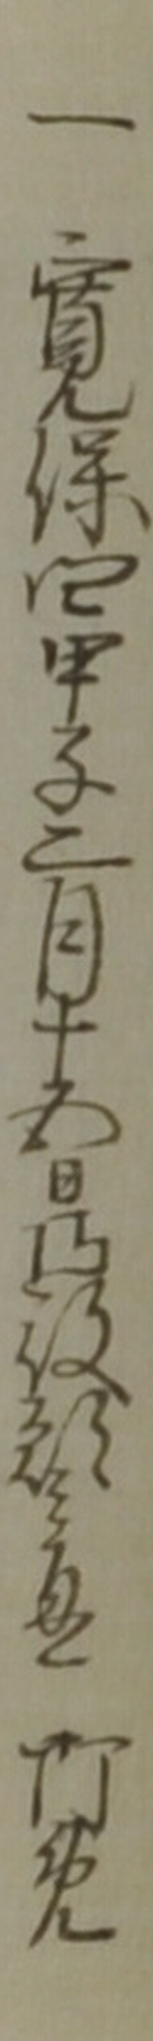一寛保四甲子二月十五日御役願之通御免
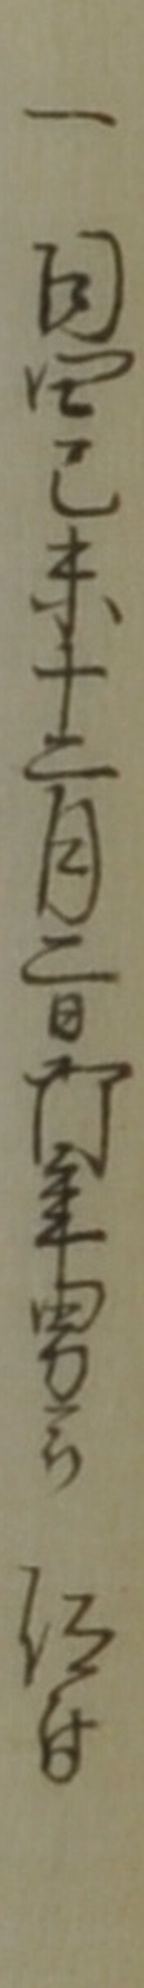一同四己未十二月二日御年男被仰付
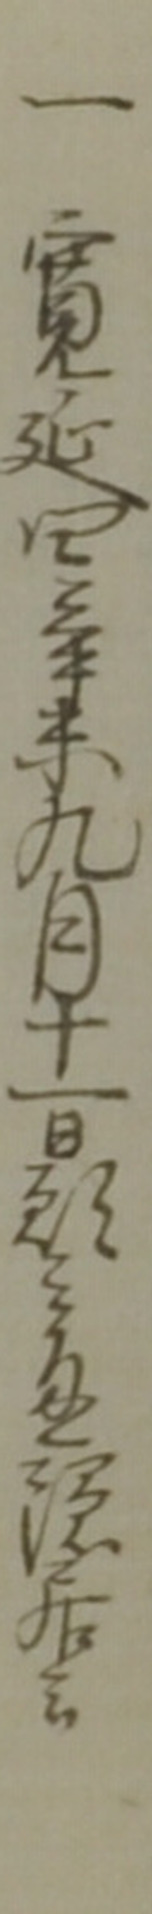一寛延四辛未九月十一日願之通隠居被
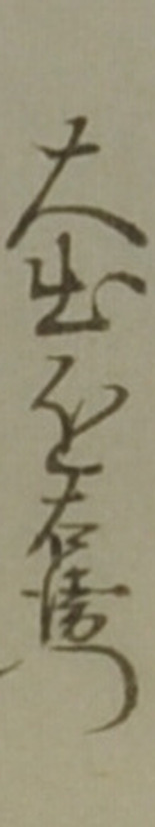大出近右衛門

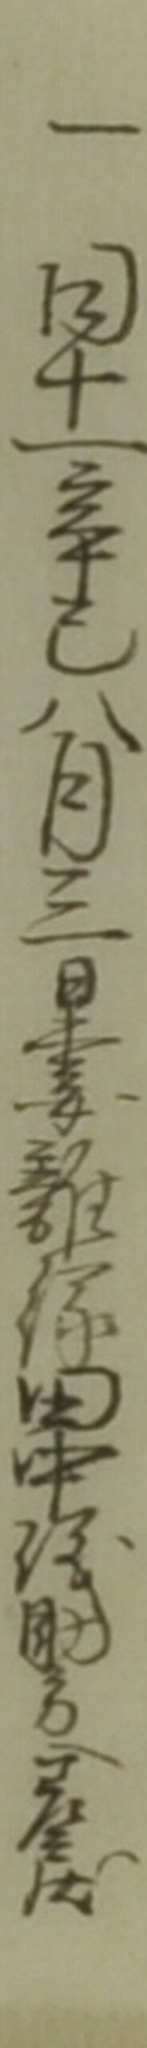一同十一辛巳八月三日妻離縁田中儀助方差戻
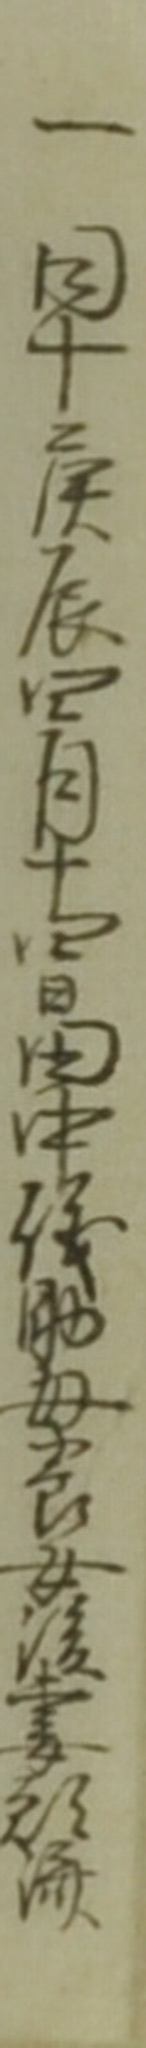一同十庚辰四月十四日田中儀助母養女後妻願済
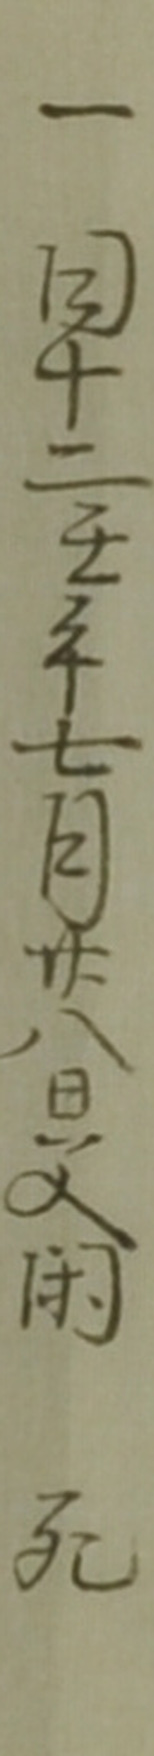一同十二壬午七月廿八日父閑死
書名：無足廃家（弐）
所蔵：伊那市立高遠町図書館・合同会社AMANE
